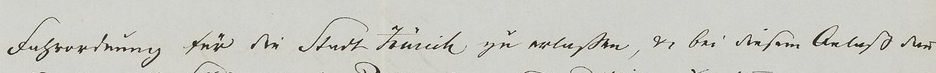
Fahrordnung für die Stadt Zürich zu erlassen, & bei diesem Anlaß dann
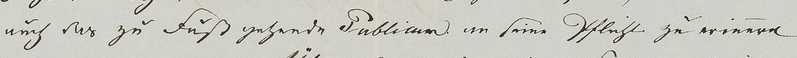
auch das zu Fuß gehende Publicum an seine Pflicht zu erinnern.
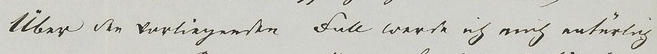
Über den vorliegenden Fall werde ich mich natürlich
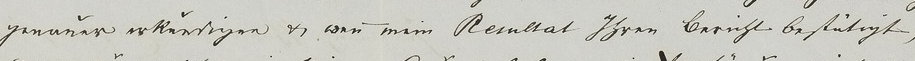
genauer erkundigen & wenn mein Resultat Ihren Bericht bestätigt,
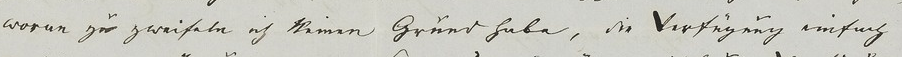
woran zu zweifeln ich keinen Grund habe, die Verfügung einfach
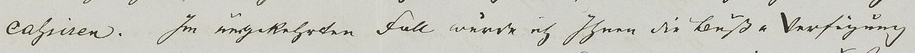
cassiren. Im umgekehrten Fall würde ich Ihnen die Buß-Verfügung
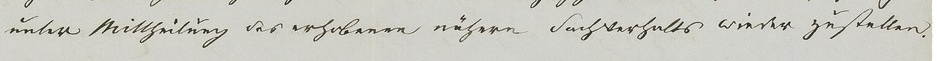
unter Mittheilung des erhobenen nähern Sachverhalts wieder zustellen.
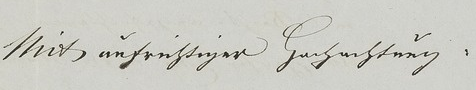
Mit aufrichtiger Hochachtung:
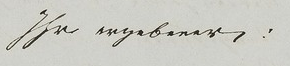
Ihr ergebener:
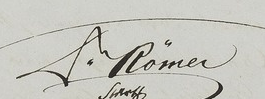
Dr Römer
